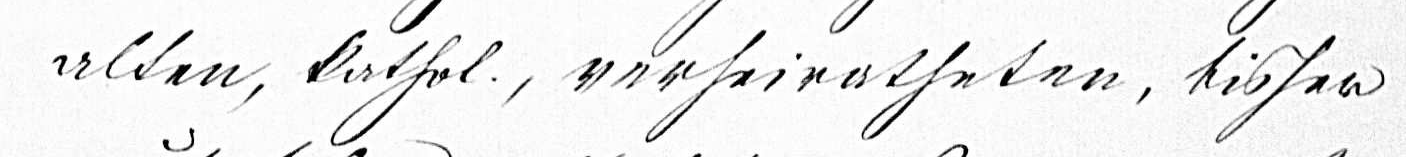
alten kathol., verheiratheten, bisher
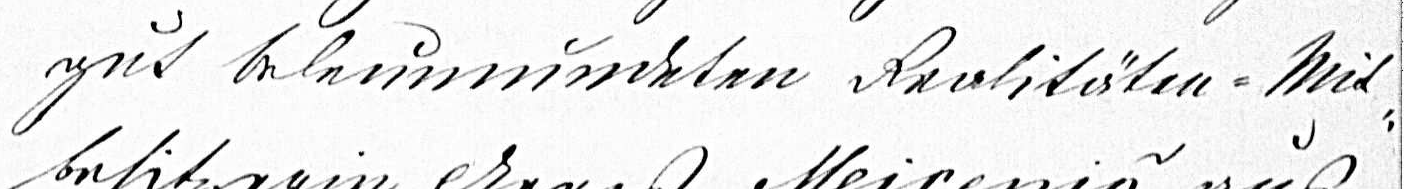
gut beleumundeten Realitäten-Mit¬
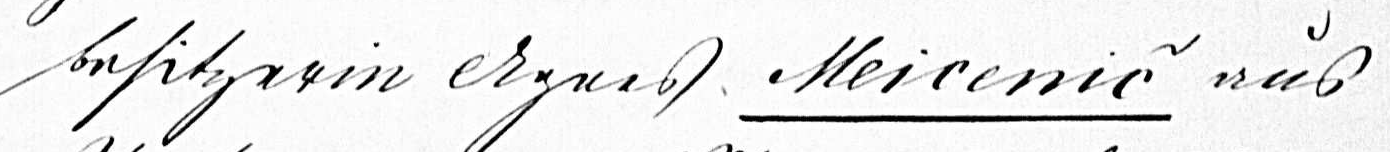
besitzerin Agnes Meicenič aus
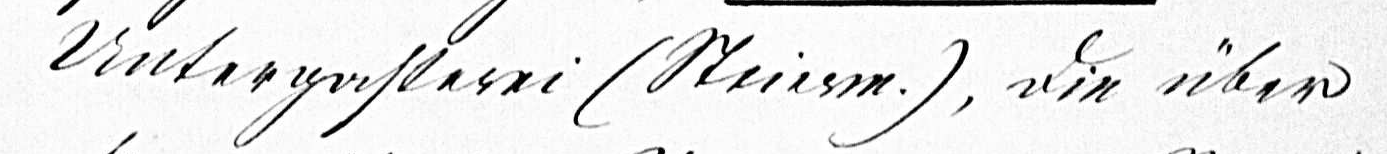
Untergasterei (Steierm.), die über
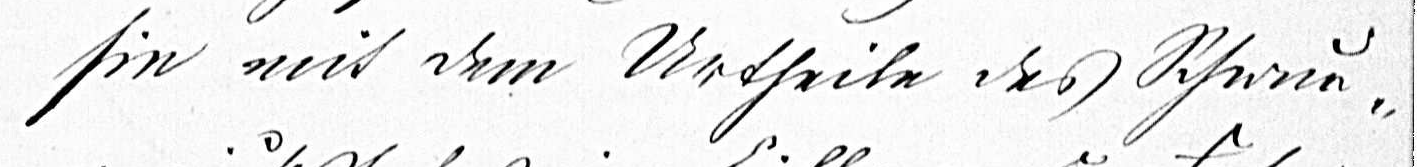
sie mit dem Urtheile des Schwu¬
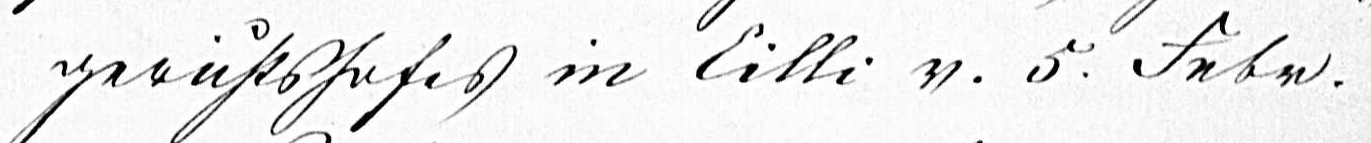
rengerichtshofes in Cilli v. 5. Febr.
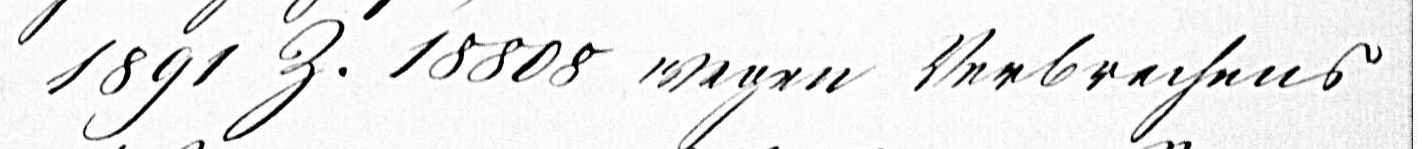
1891 Z 18808 wegen Verbrechens
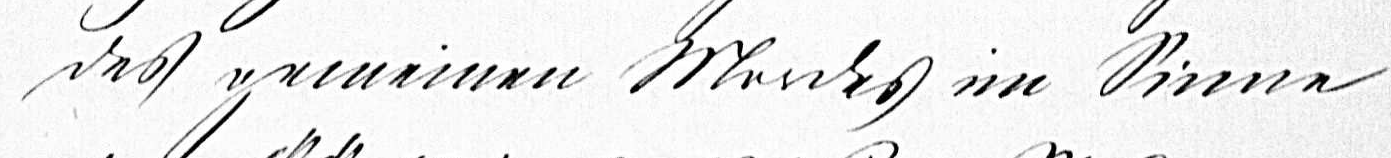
des gemeinen Mordes im Sinne
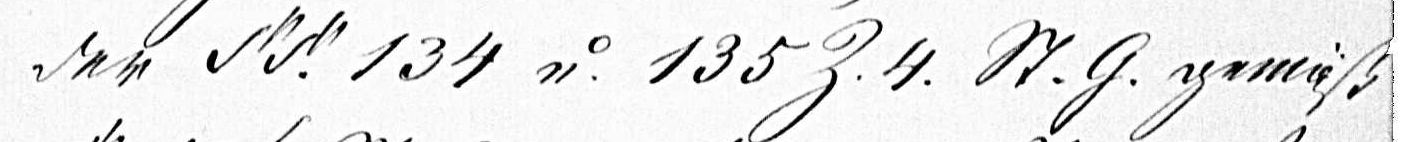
der §§134 u. 135 Z 4. St G. gemäß
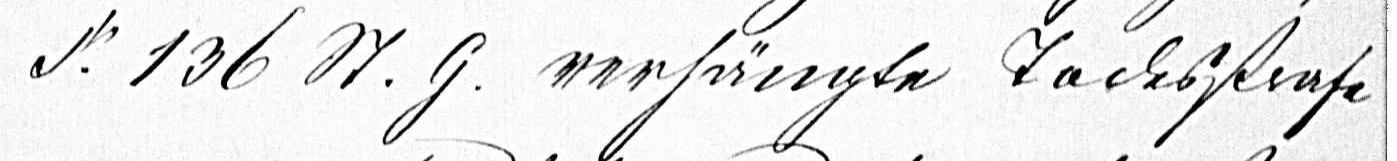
§136 St G verhängte Todesstrafe
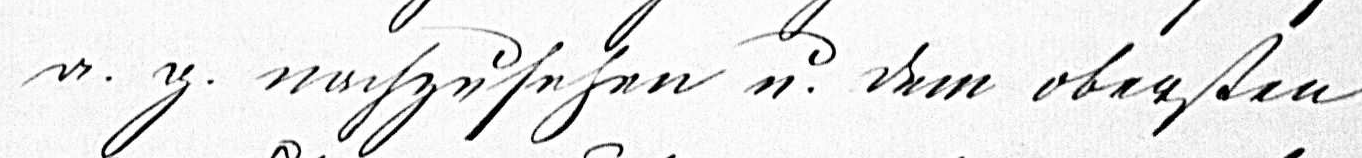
a.g. nachzusehen u dem obersten
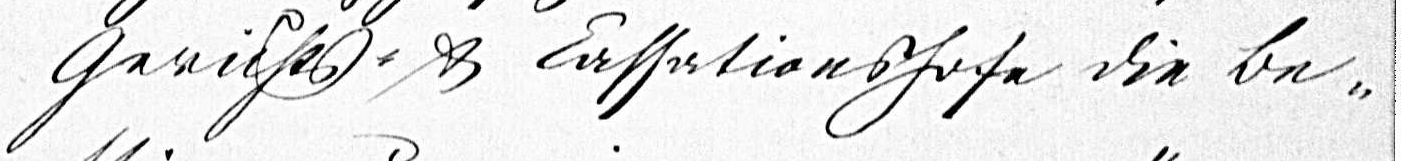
Gerichts- u. Cassationshofe die Be¬
